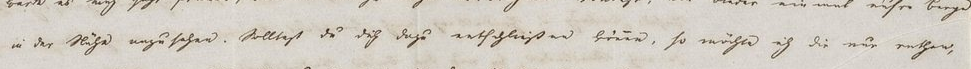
in der Nähe anzusehen. Solltest Du Dich dazu entschließen können, so möchte ich Dir nur rathen,
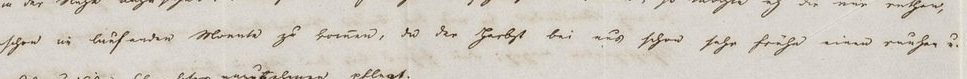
schon im laufenden Monate zu kommen, da der Herbst bei uns schon sehr frühe einen rauhen u.
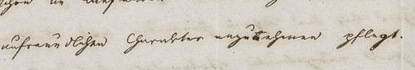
unfreundlichen Charakter anzunehmen pflegt.
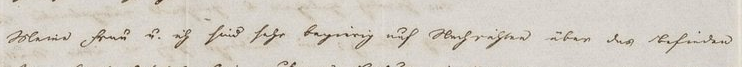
Meine Frau u. ich sind sehr begierig auf Nachrichten über das Befinden
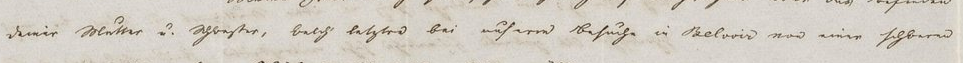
Deiner Mutter u. Schwester, welch' letztre bei unserm Besuche in Belvoir von einer schweren
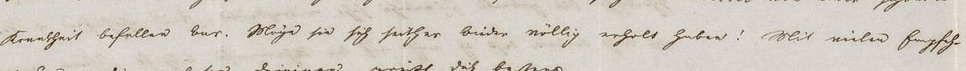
Krankheit befallen war. Möge sie sich seither wieder völlig erholt haben! Mit vielen Empfeh-
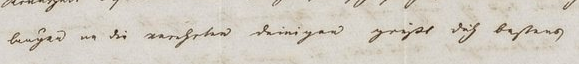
lungen an die verehrten Deinigen grüßt Dich bestens
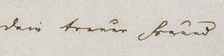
Dein treuer Freund
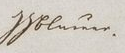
J J Blumer.
